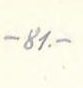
81
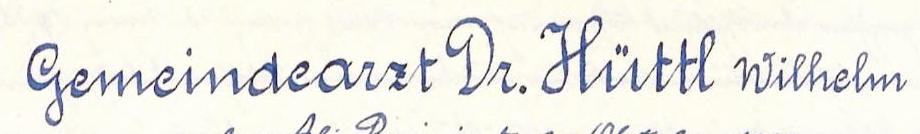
Gemeindearzt Dr. Hüttl Wilhelm
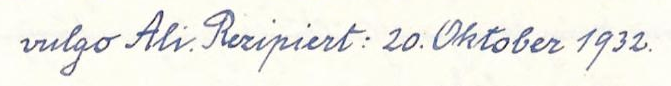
vulgo Ali. Rezipiert: 20. Oktober 1932.
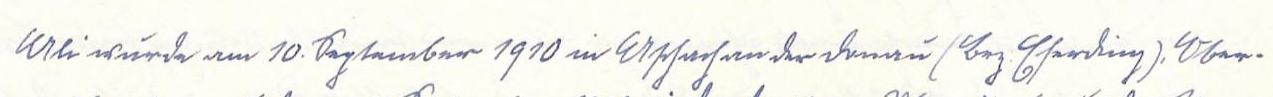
Ali wurde am 10. September 1910 in Aschach an der Donau (Bez Eferding )Ober-
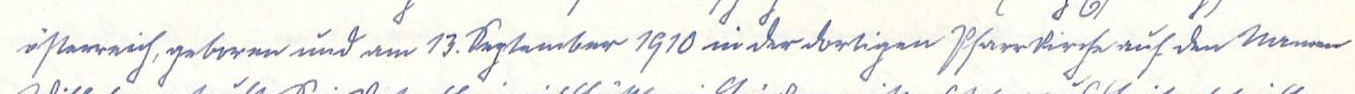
östereich, geboren und am 13. September 1910 in der dortigen Pfarrkirche auf den Namen
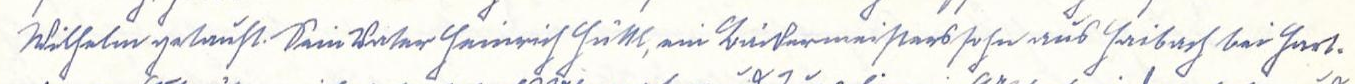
Wilhelm getauft. Sein Vater Heinrich Hüttl, ein Bäckermeisterssohn aus Haibach bei Hart-
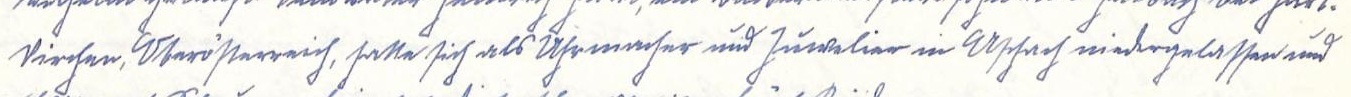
kirchen, Oberösterreich, hatte sich als Uhrmacher und Juwelier in Aschach niedergelassen und
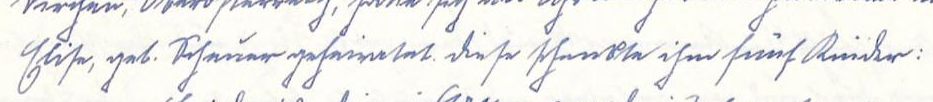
Elise, geb. Scheuer geheiratet. Diese schenkte ihm fünf Kinder:
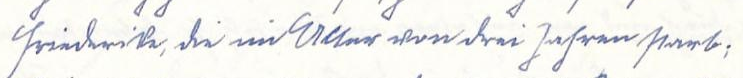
Friederike, die im Alter von drei Jahren starb;
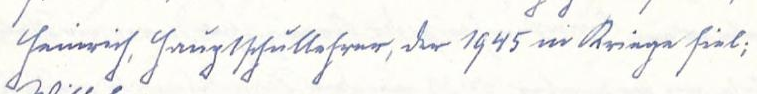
Heinrich, Hauptschullehrer, der 1945 in Kriege fiel-
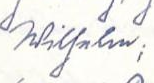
Wilhelm;
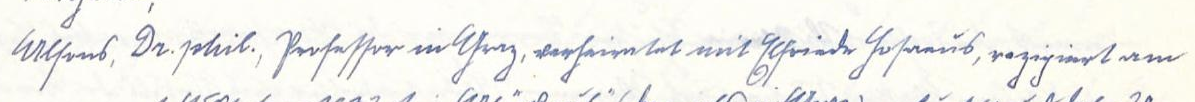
Alfons, Dr. phil., Professor in Graz, verheiratet mit Elfriede Hosarus, rezipiert am
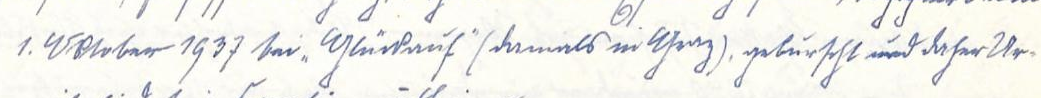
1. Oktober 1937 bei „Glückauf" (damals in Graz), geburscht und daher Ur-
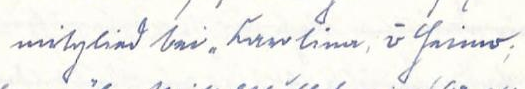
mitglied bei „Carolna, v/o. Heimo,
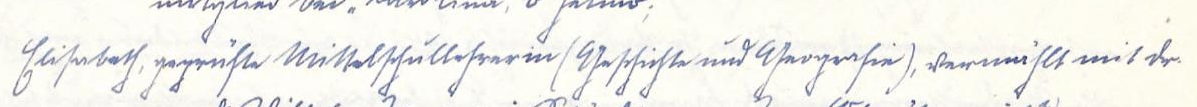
Elisabeth, geprüfte Mittelschullehrerin,(Geschichte und Geografie) vernmählt mit Dr.
